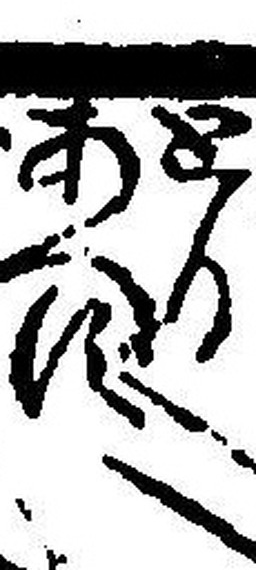あへす
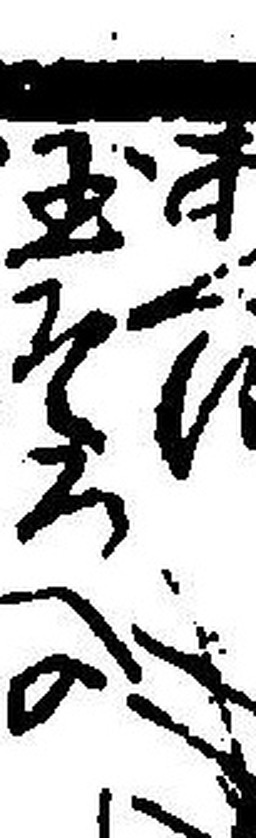玉そろへの
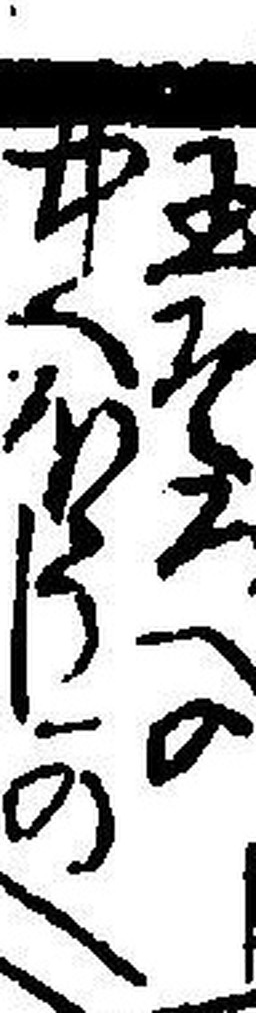中へほうしの
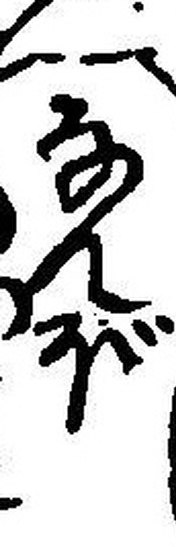なんぼ
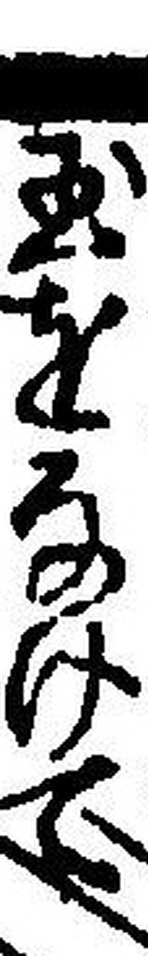玉をなけて
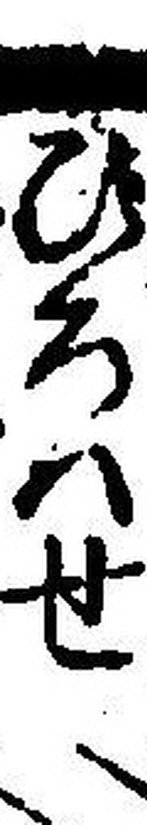ひろはせ
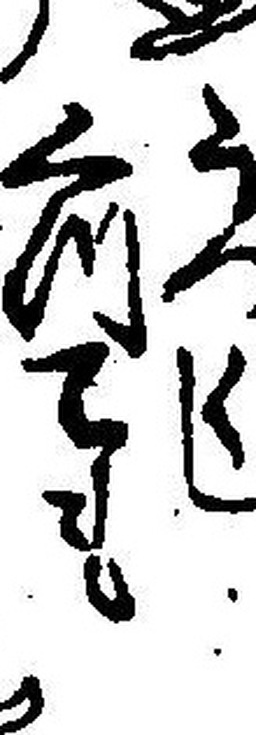くつても
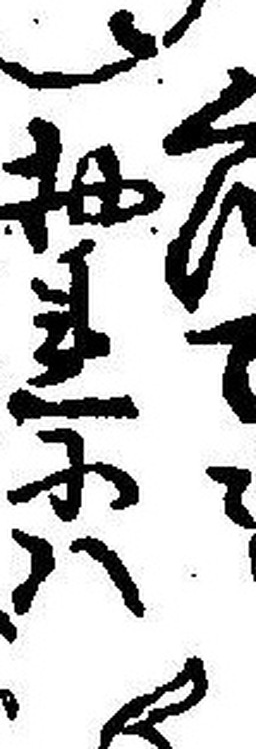おれには
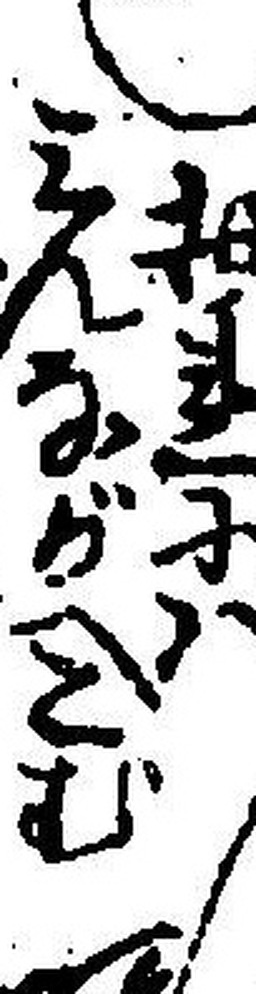みんながへこむ
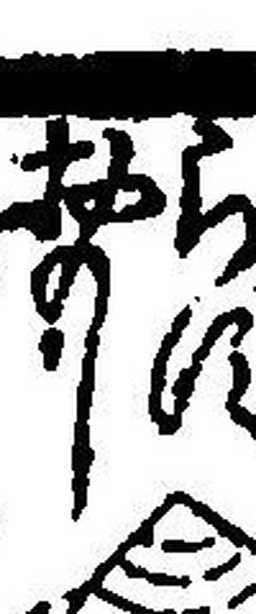おもし
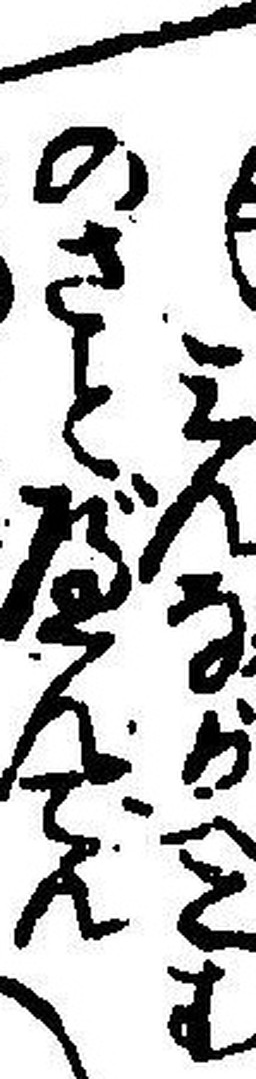のさとべんてん
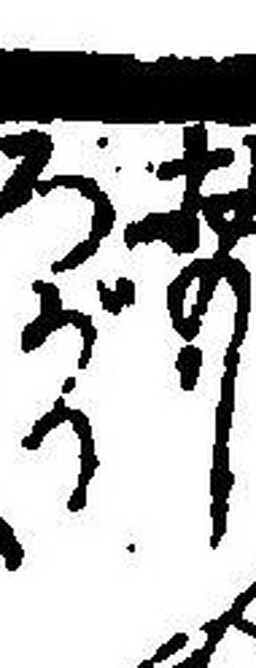ろがり
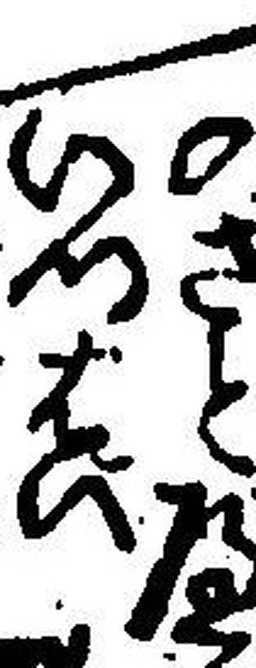いつはい
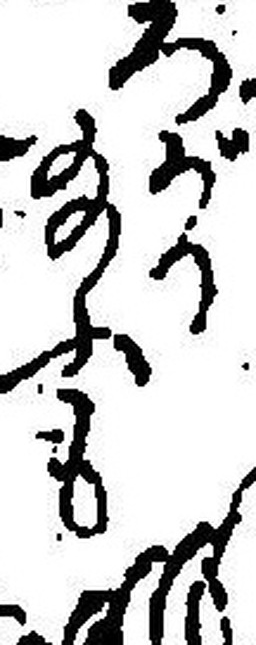給ふも
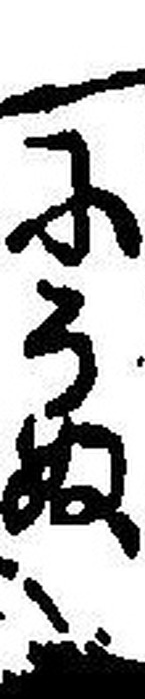にうぬ
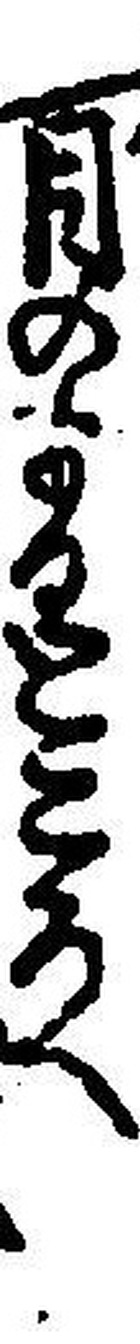▲目のよるところへ
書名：徳若水縁起金性 / 樹下石上作
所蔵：東京大学総合図書館 General Library in the University of Tokyo, JAPAN
